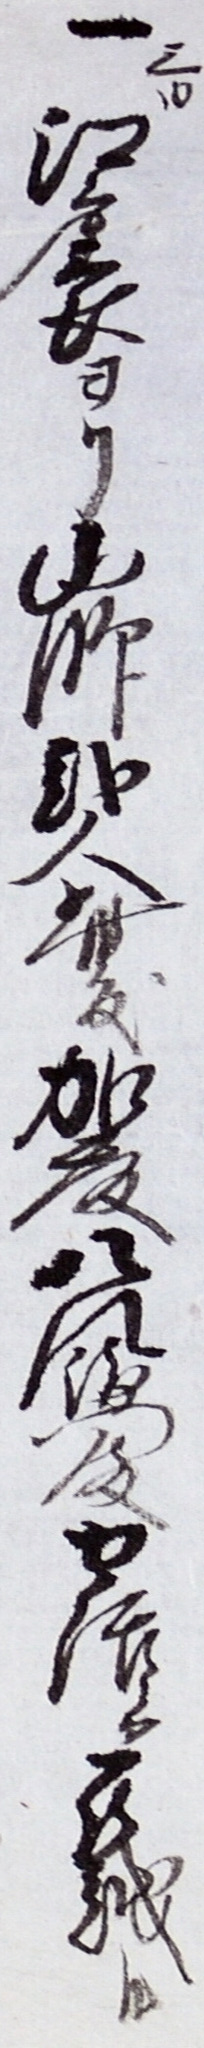一江戸表ヨリ山師弐人此度加藤八左衛門殿せ話ニ而罷越候
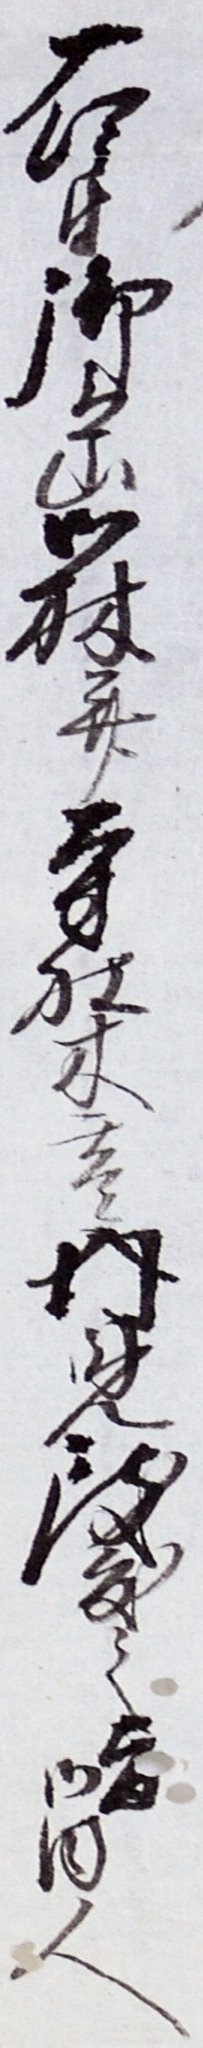右ニ付御立山御林并寺社木共ニ内見致度之旨御同人
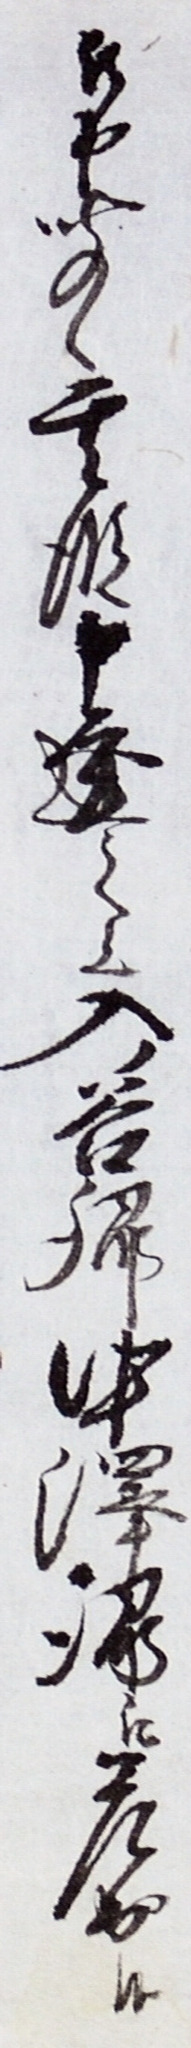被申聞候其段申達之上入ノ谷郷中沢郷江差出候
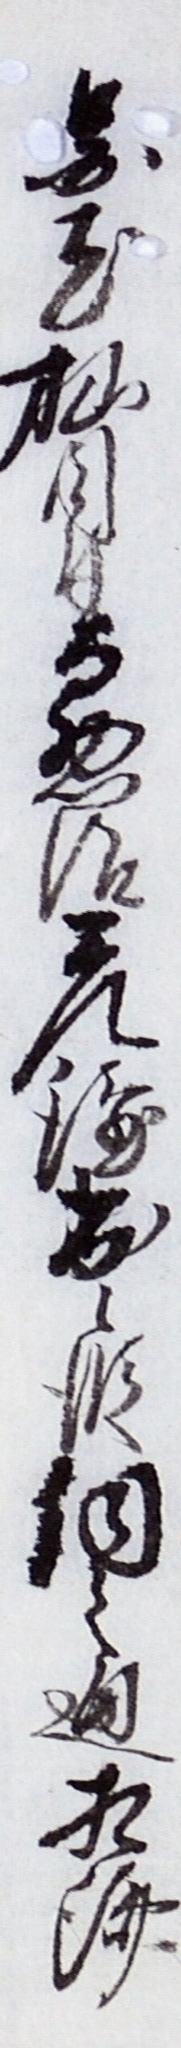図尤杣目付与惣治差添出候段伺之通相済
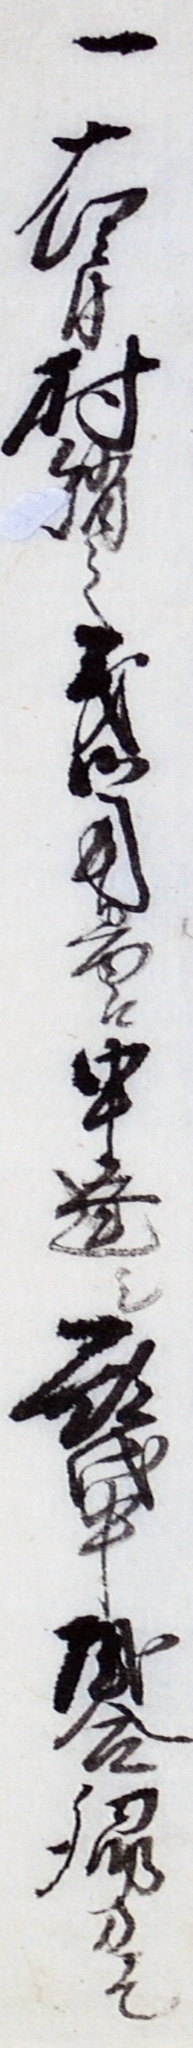一右ニ付村賄之義御用番江申達シ郡代中掛合郷方ニて
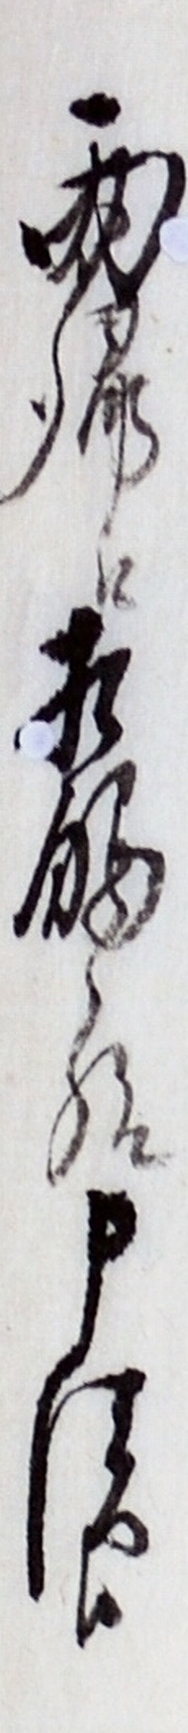両郷江相触候様申談候
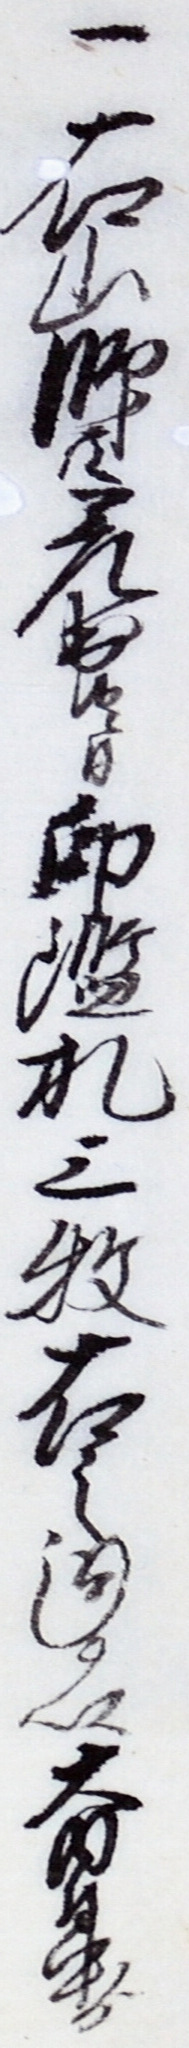一右山師共差出候ニ付印鑑札三枚右之趣ヲ以大目付中より
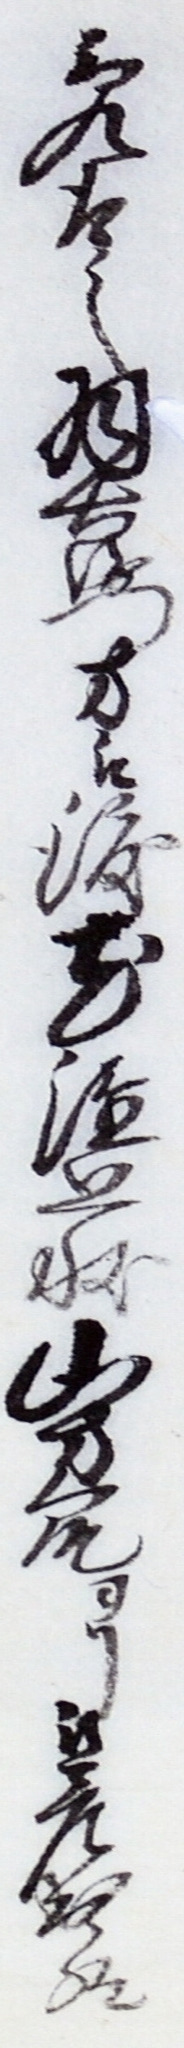受取之羽右衛門方江渡尤添廻状山方衆ヨリ被差出候様
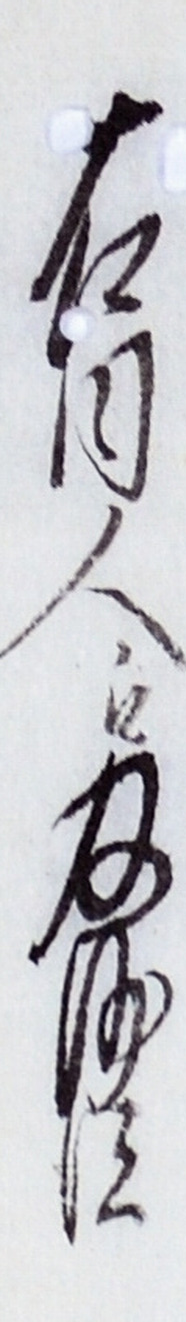右同人江及沙汰
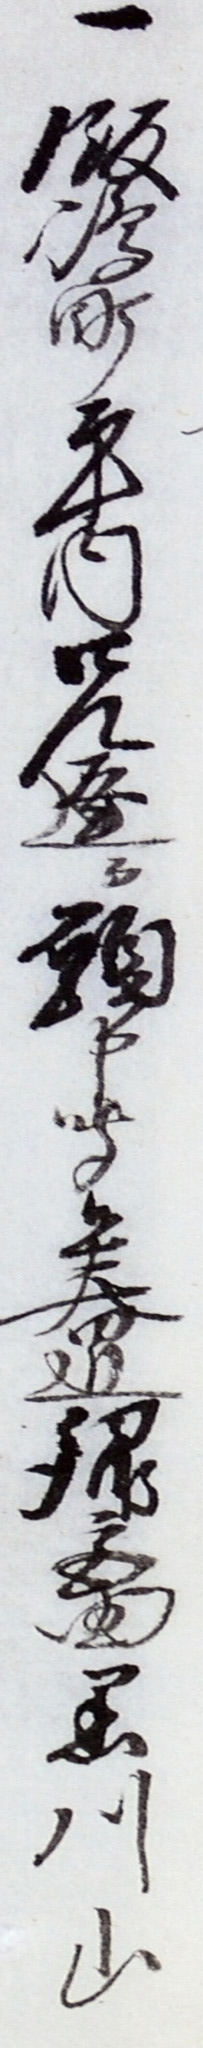一飯嶋町平内先達而願申聞候春近郷宮田黒川山
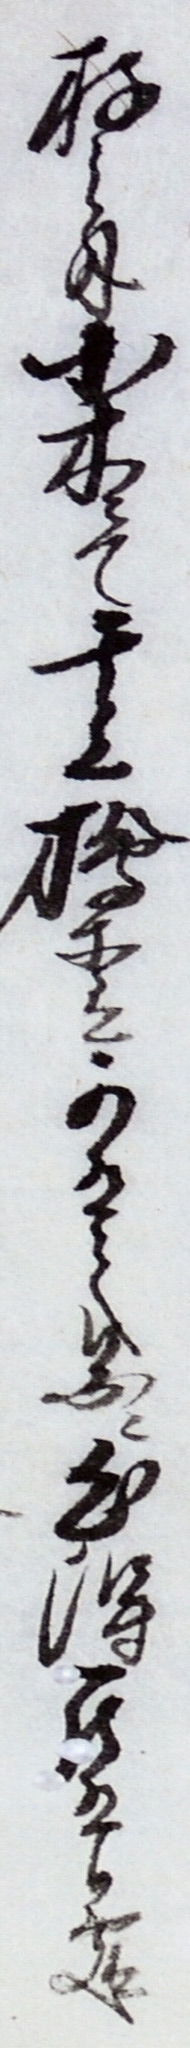存之外小木ニて其上檜木立可有之図ニ心得罷有候処
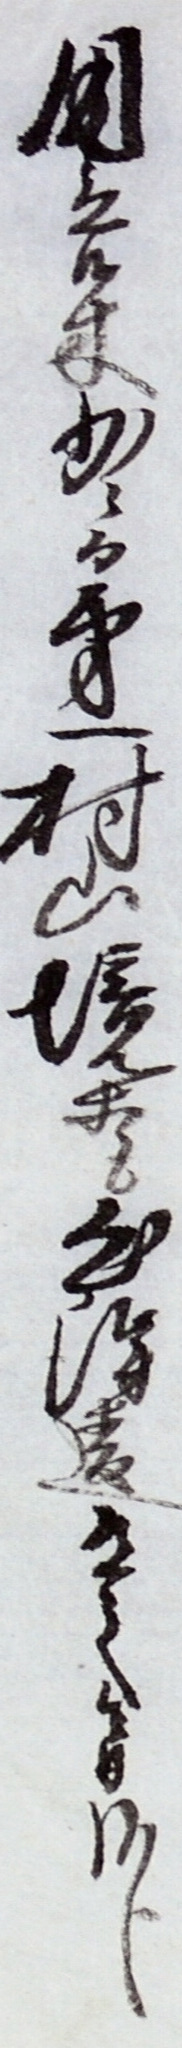用立候木少ニ而第一村山境等も心得違有之候ニ付何分
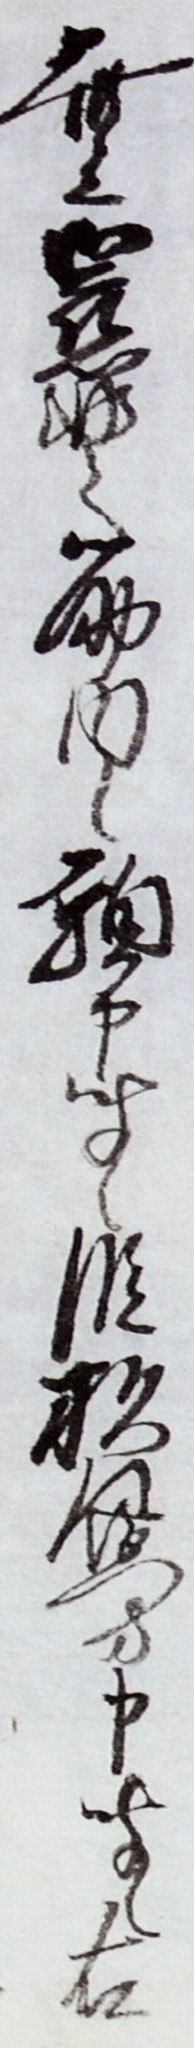此上御慈悲之筋内々願申聞候段杉右衛門方申聞候右
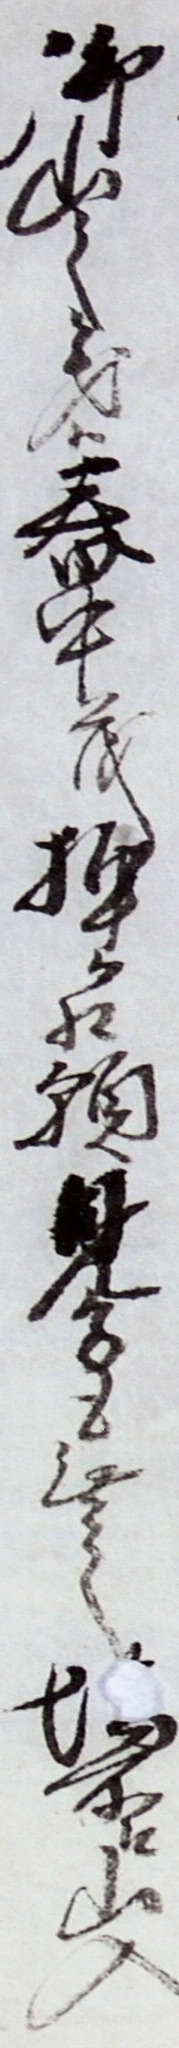御山之義は春中も押而相願見分も無之場所江山入
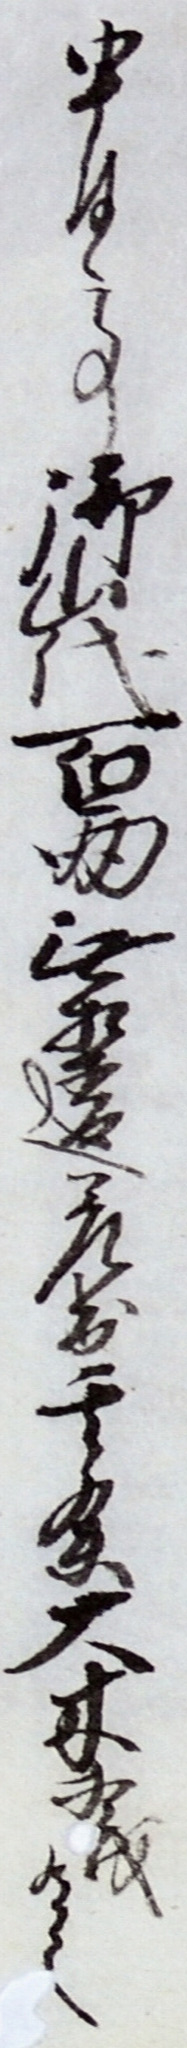申付候事御山代百両無相違差出其余大木相伐有之
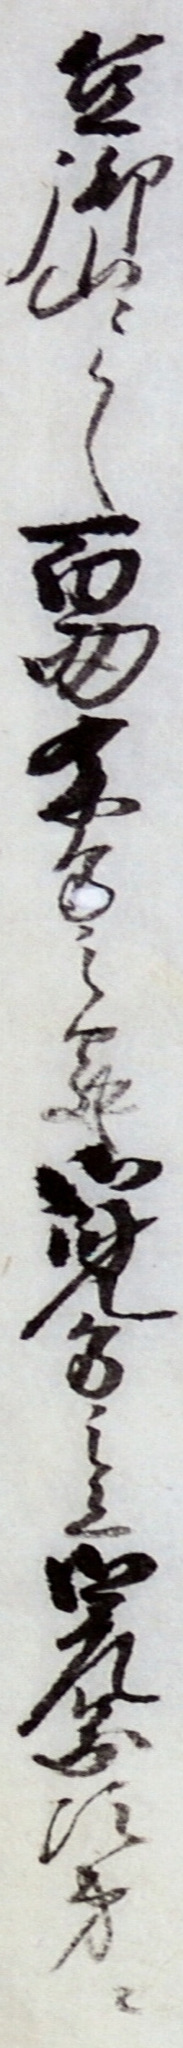宜御山ニて百両木分之処御見分之上御差図次第ニ
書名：御山奉行御用控
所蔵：伊那市立高遠町図書館・合同会社AMANE
